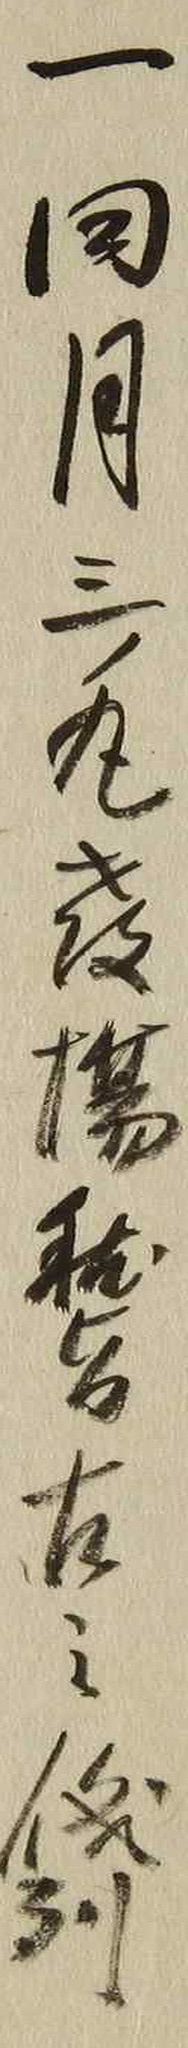一同月三ノ丸教場稽古之儀列
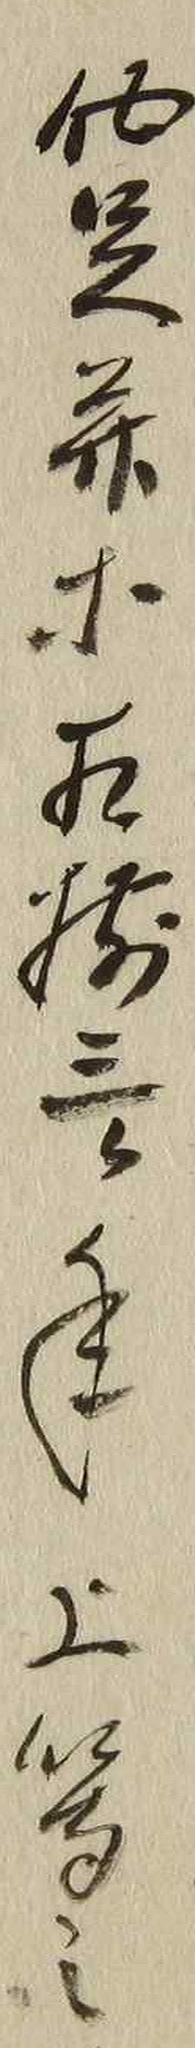伍足並等相揃三ケ年上等之
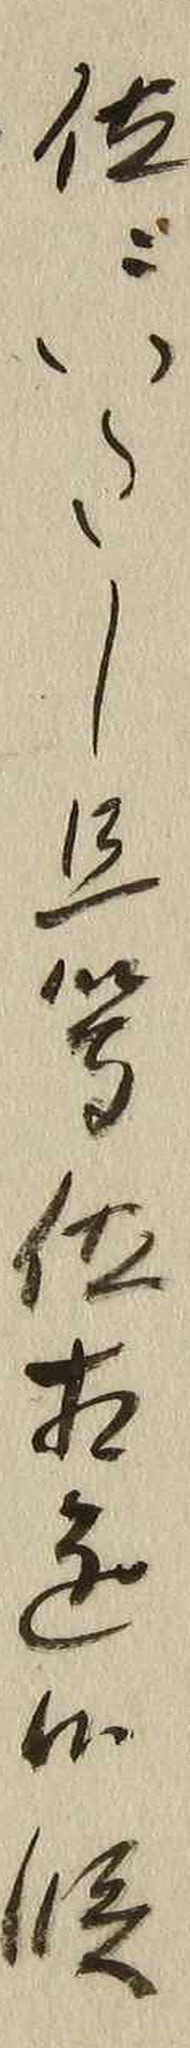位ニいたし且等位相進候段
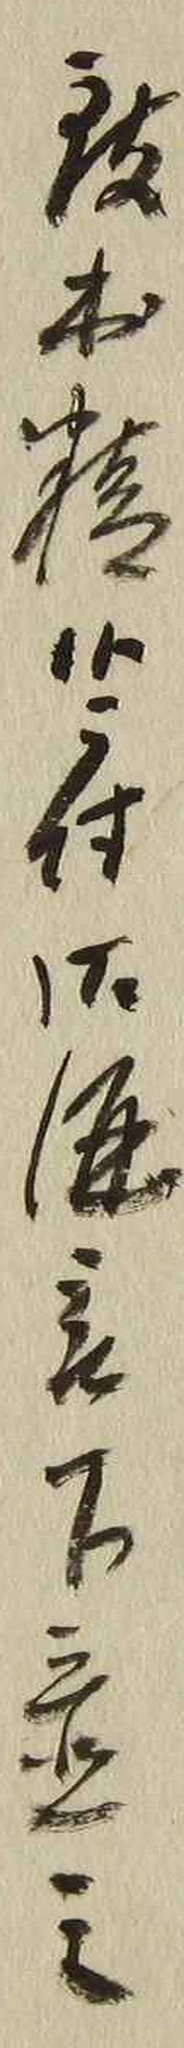致出精候ニ付御酒被下置之
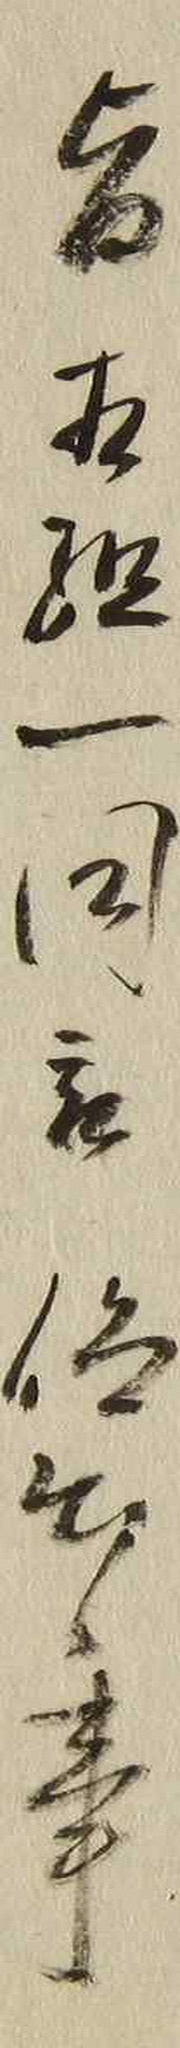旨相組一同被仰出候事
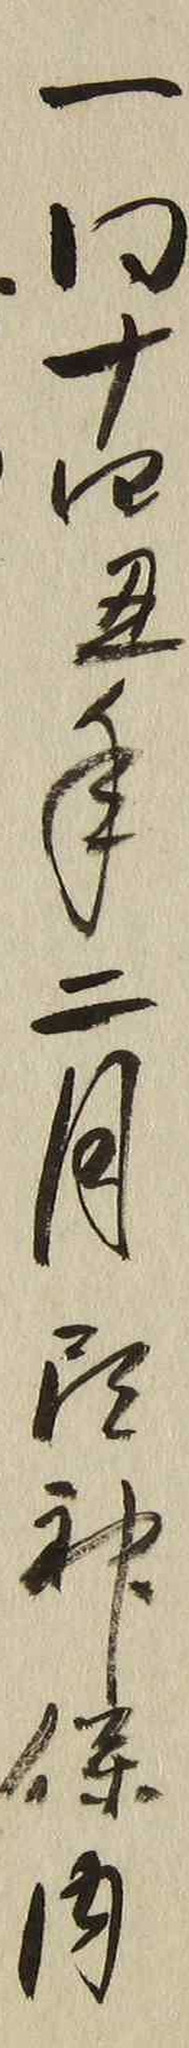一同十四丑年二月頭神保内
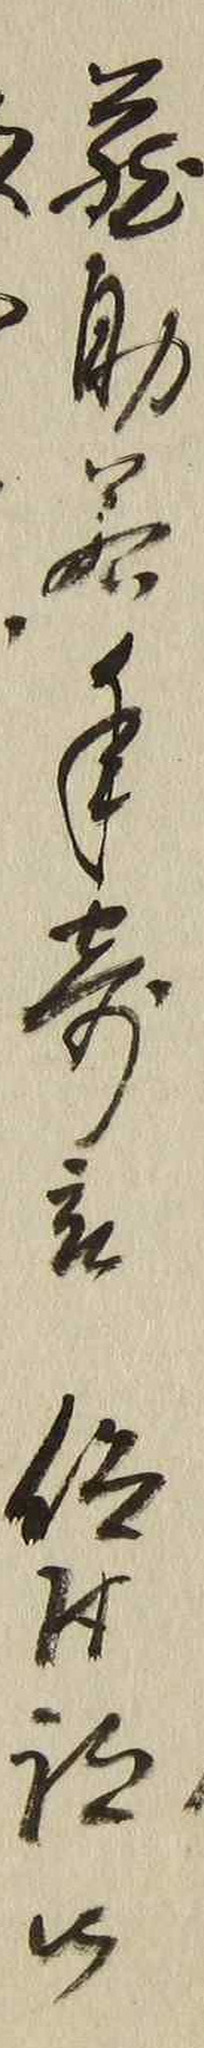蔵助若年寄被仰付跡御
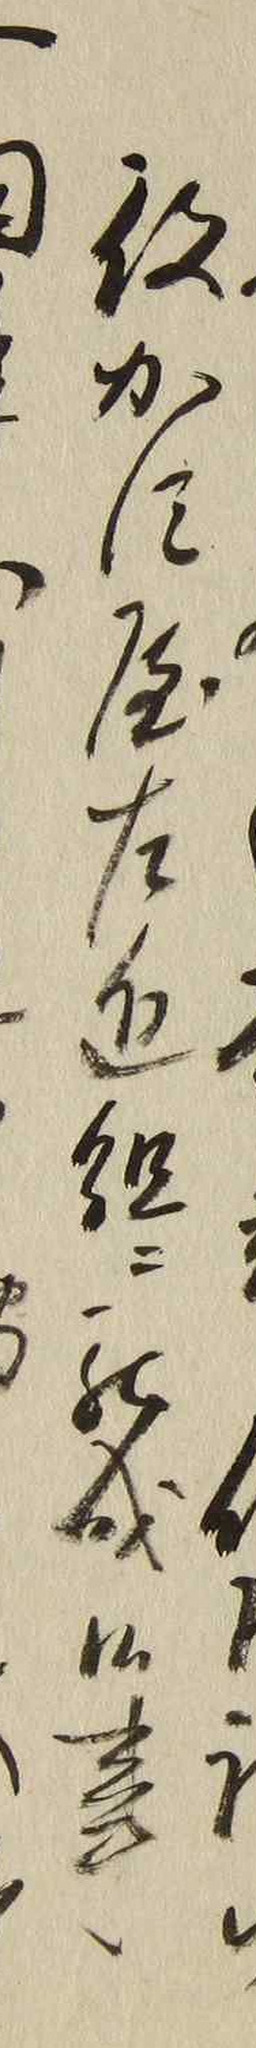役加須屋左近組ニ罷成候事
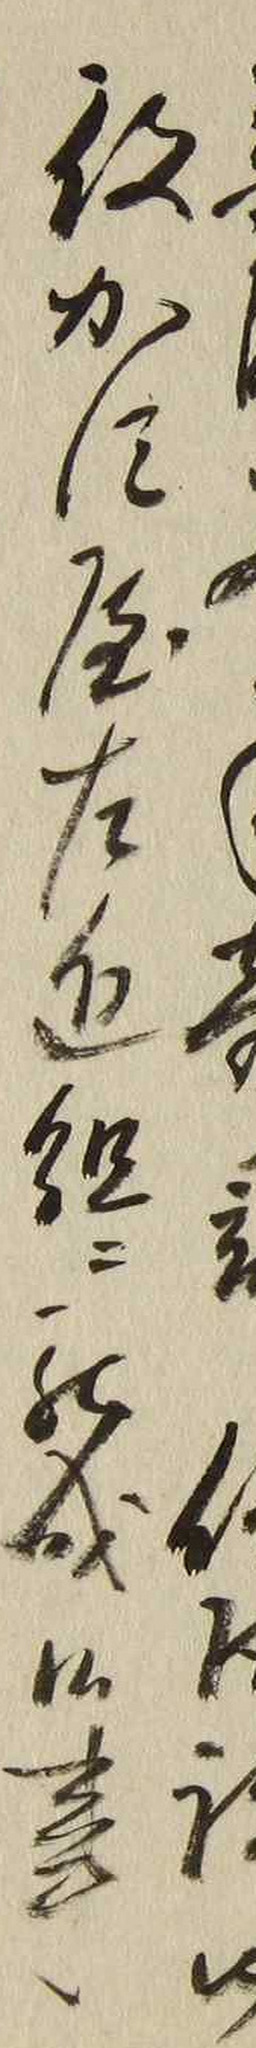役加須屋左近組ニ罷成候事
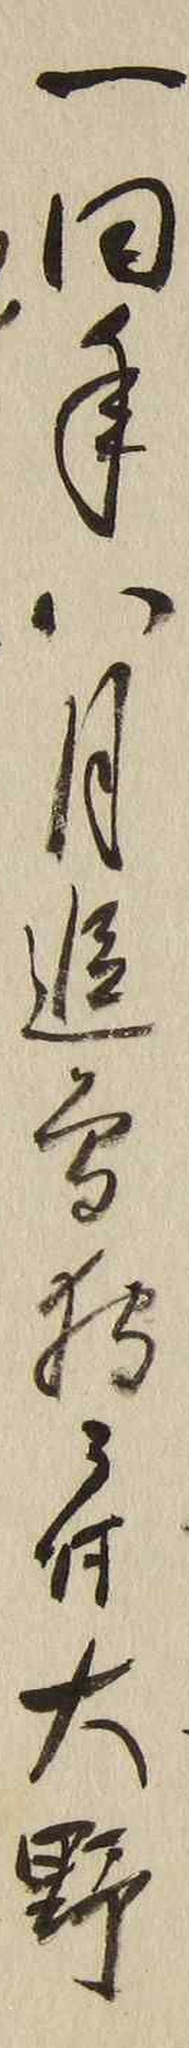一同年八月追鳥狩ニ付大野
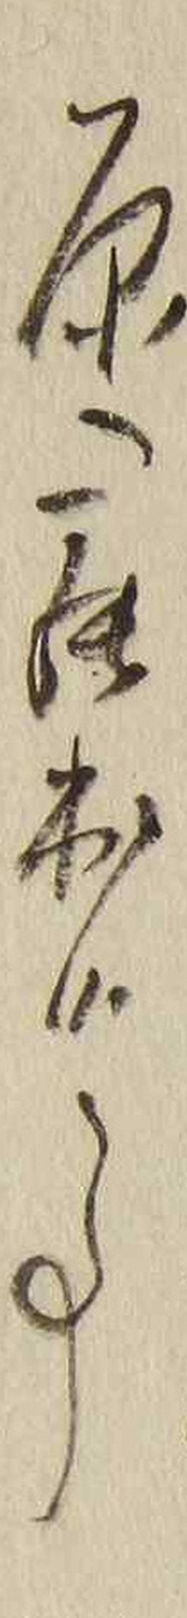原へ罷出候事

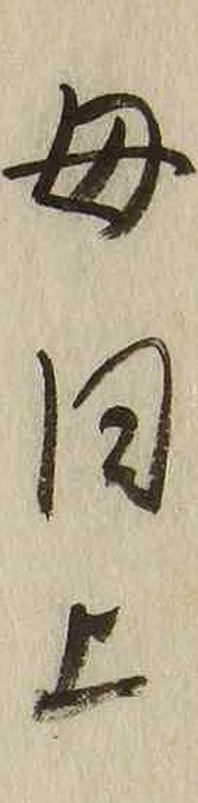母同上
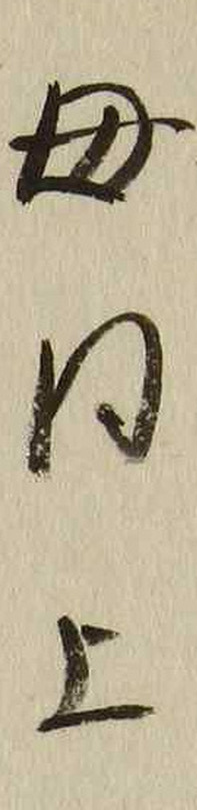母同上
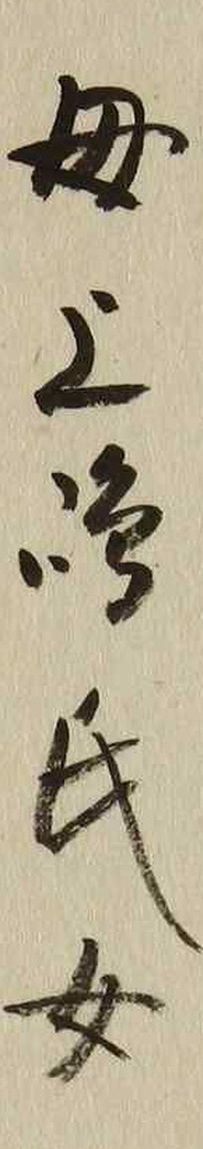母上島氏女
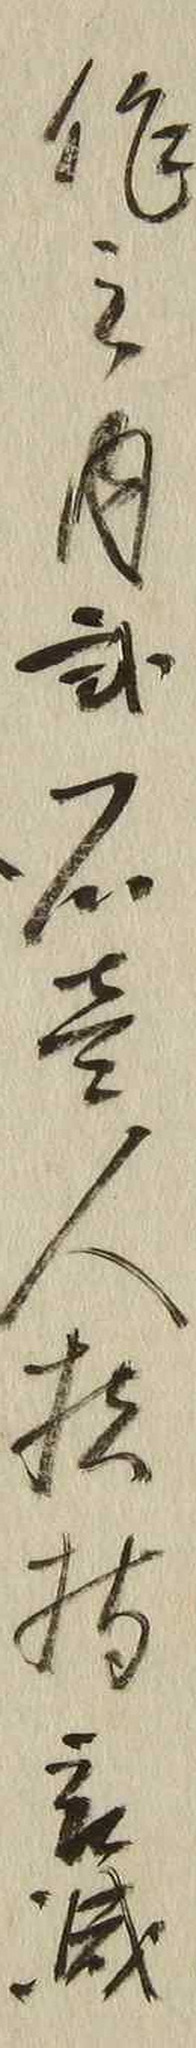作之内弐石一壱人扶持被減
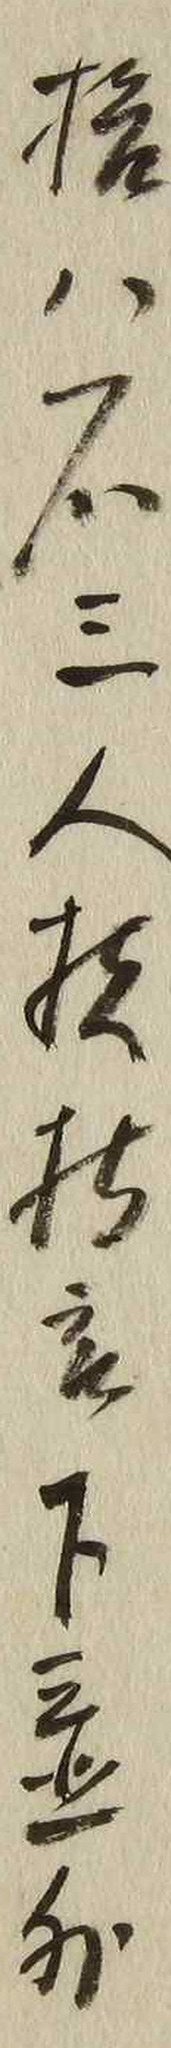拾八石三人扶持被下置外
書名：諸士系譜　巻之359　す之部9
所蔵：会津若松市立会津図書館
